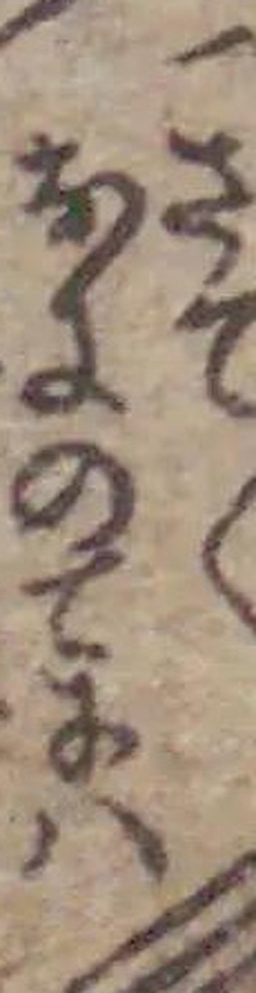おにのてには

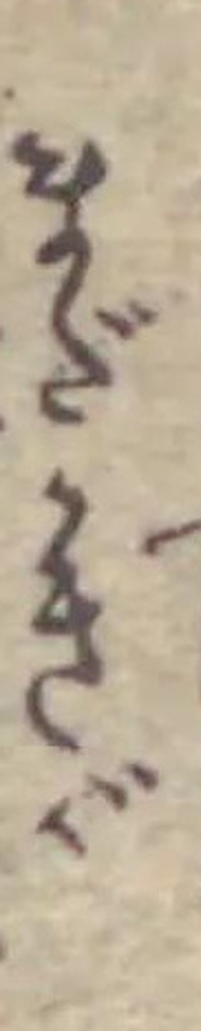まだかぎが
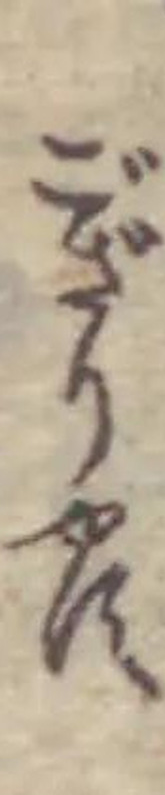ござりやす
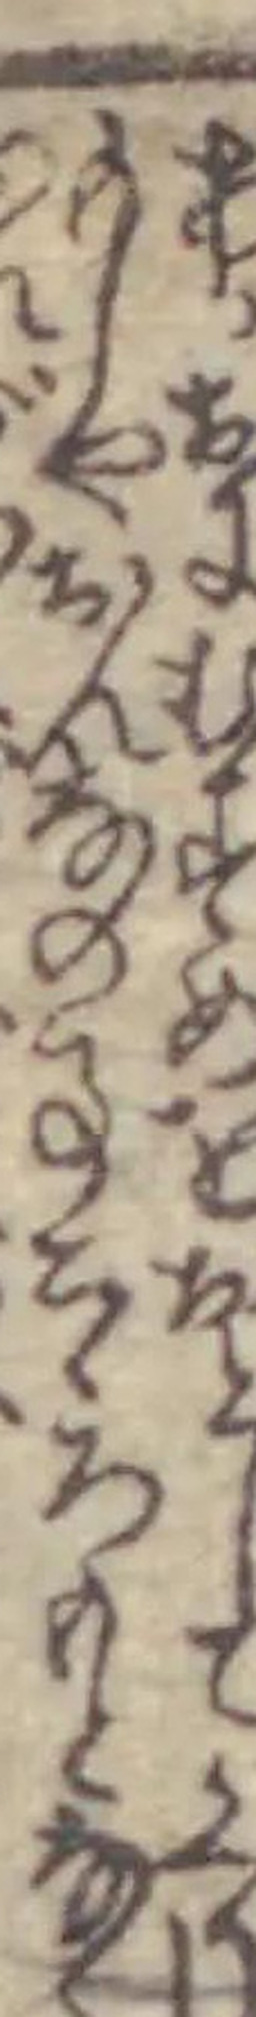もしやおんなの事こゝろもとなく
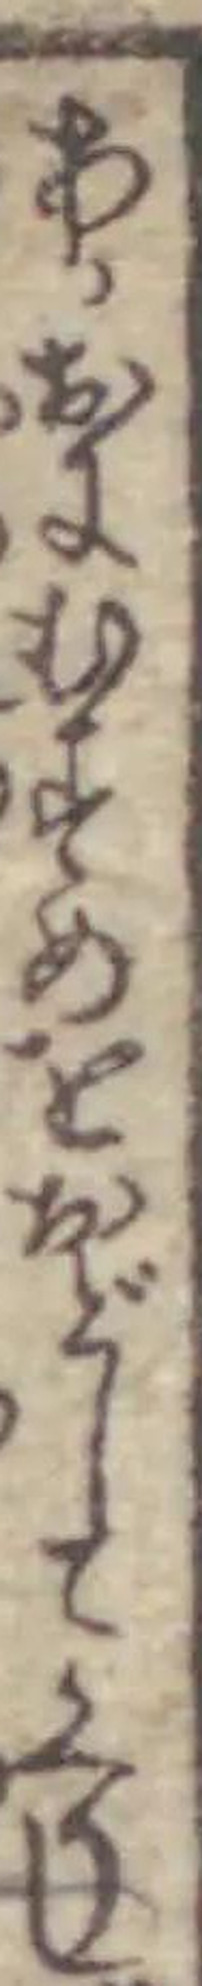あかおにむすめをおどしてかへりしが
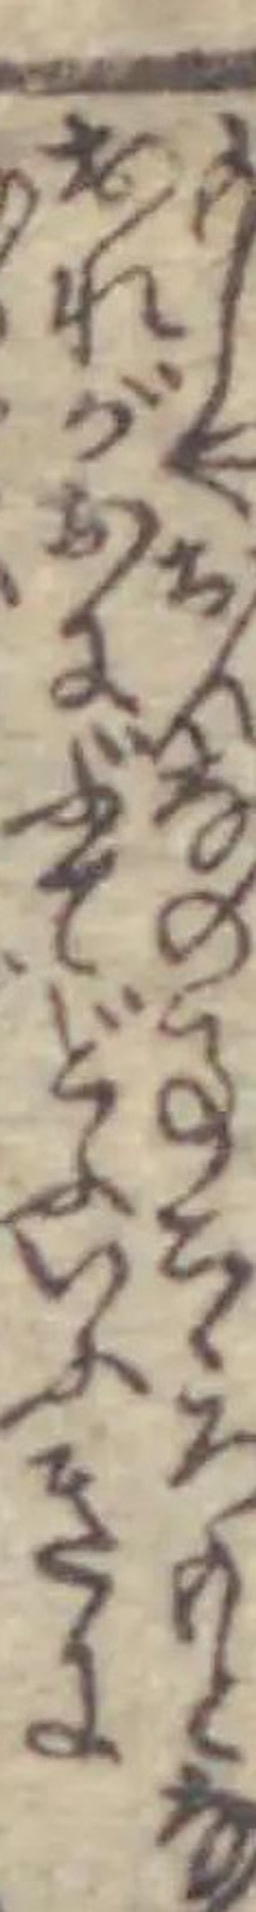おれがおにぶてどふいふきに
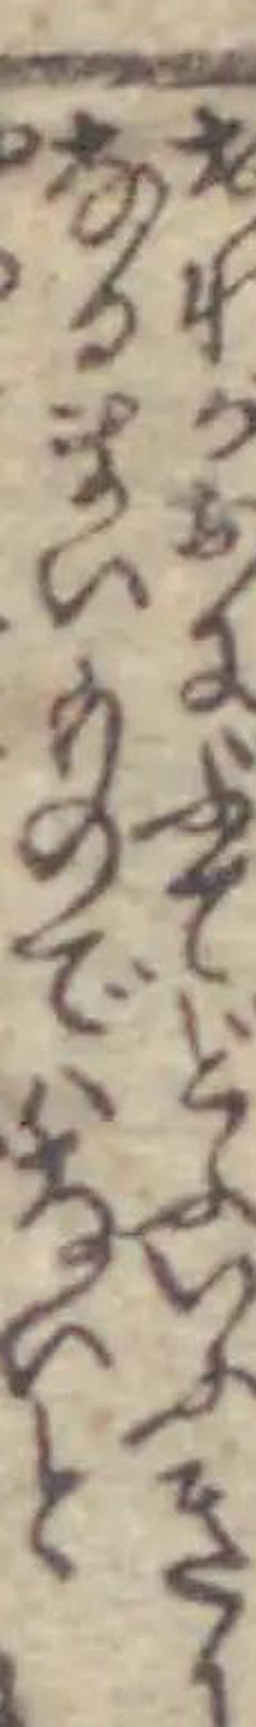なるまいものではないと
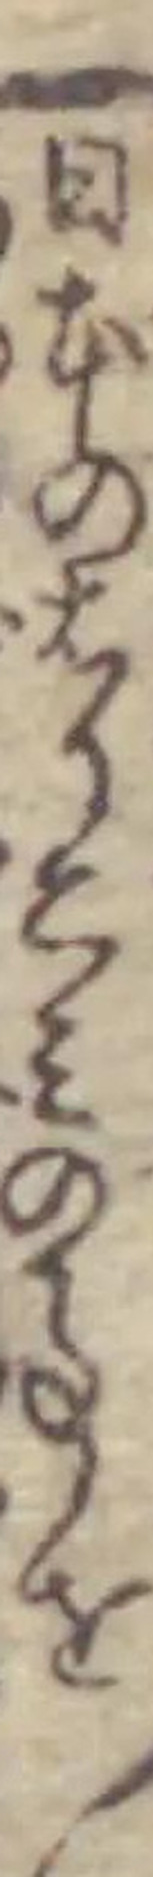日本のはりこみの事を
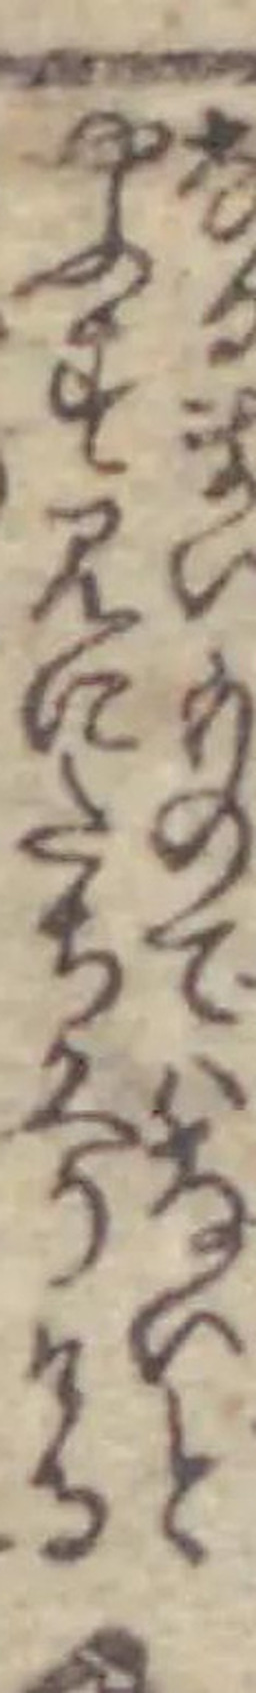やふす見にたちかへりける
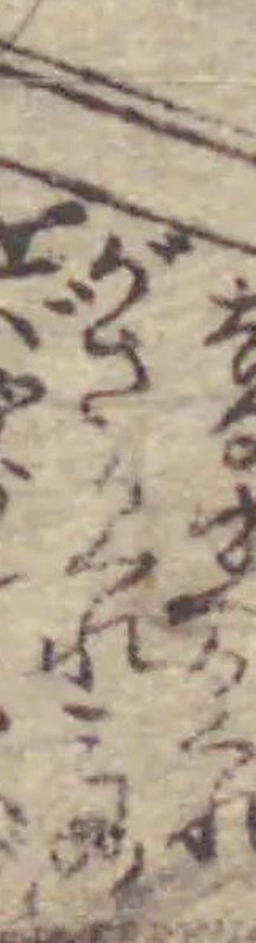がさかくれみの
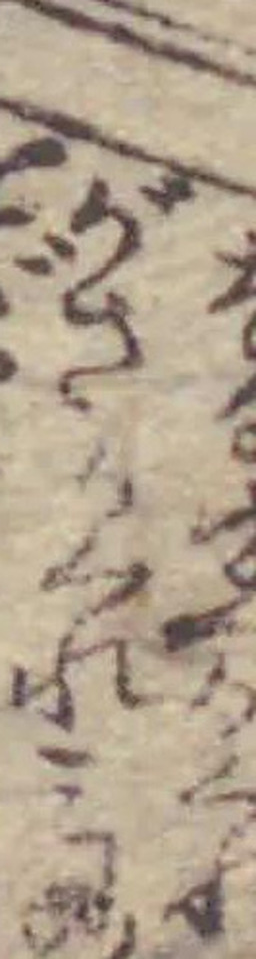がさかくれみの
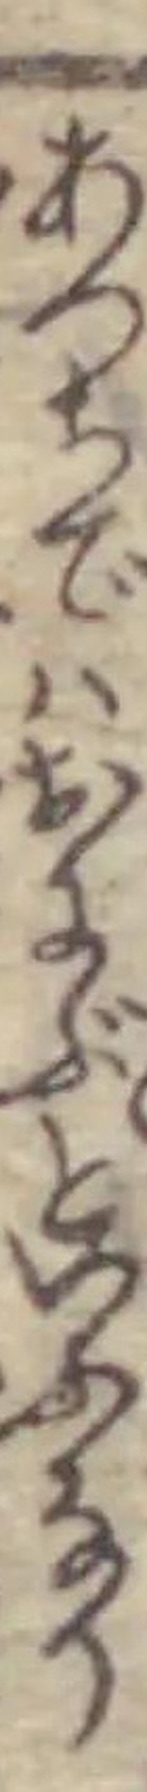あつちではおにぶといふなり
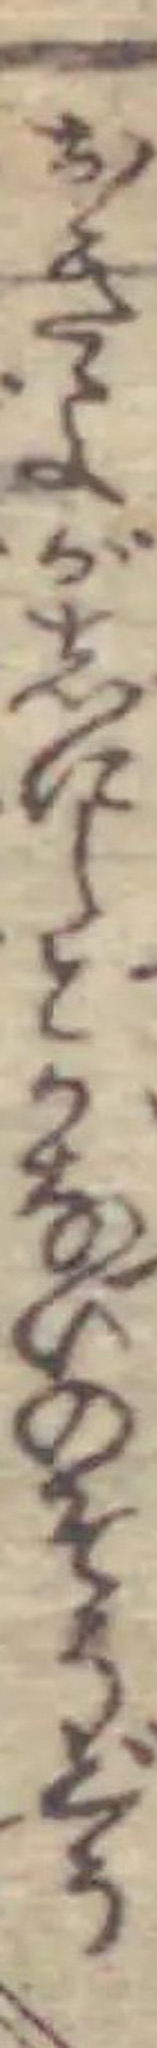おきよがしに候とかないのそうどう
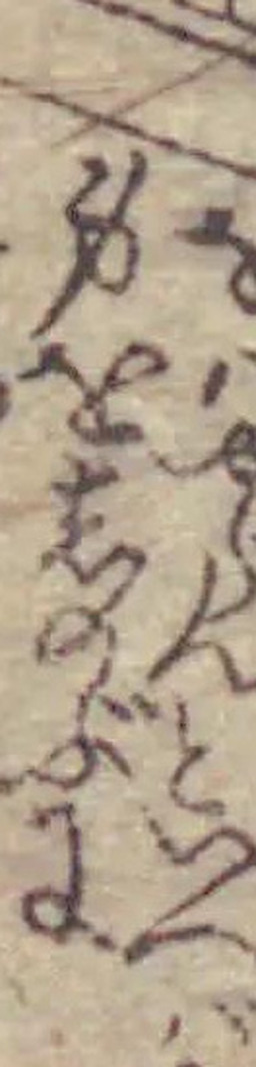身をしのぶに
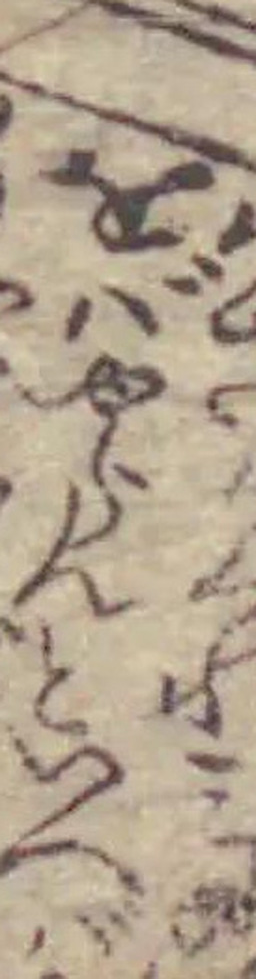をばやらんといへば
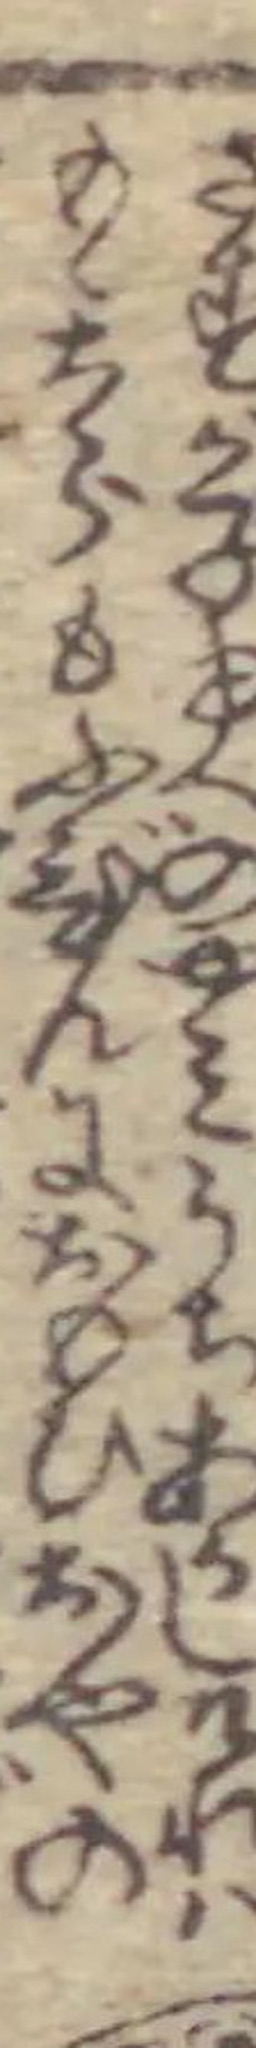もゝ太郎もふびんにおもひおやの
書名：桃太郎元服姿 2巻
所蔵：国立国会図書館 National Diet Library, JAPAN
